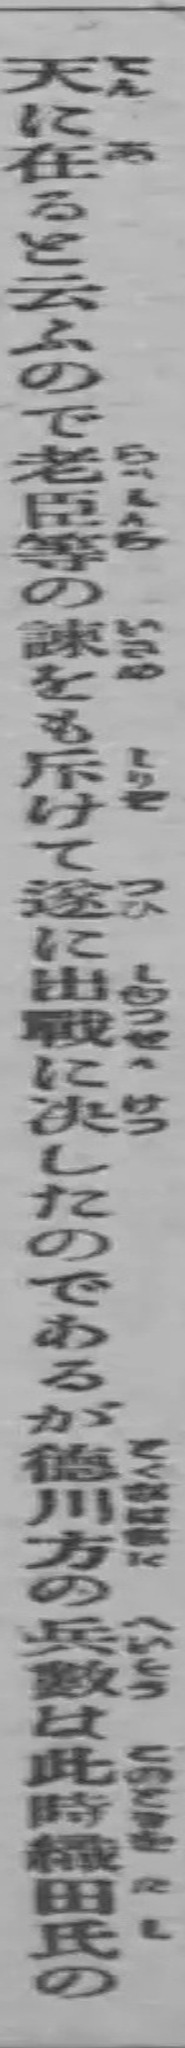天に在ると云ふので老臣等の諌をも斥けて遂に出戦に決したのであるが徳川方の兵数は此時織田氏の
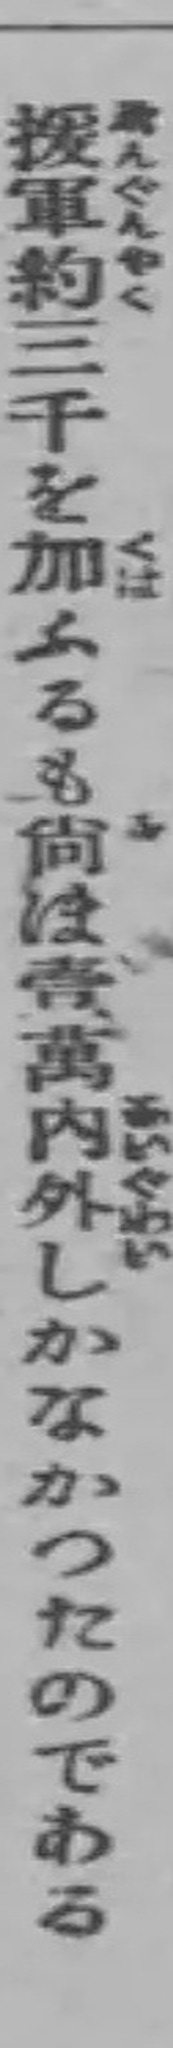援軍約三千を加ふるも尚ほ一万内外しかなかつたのである
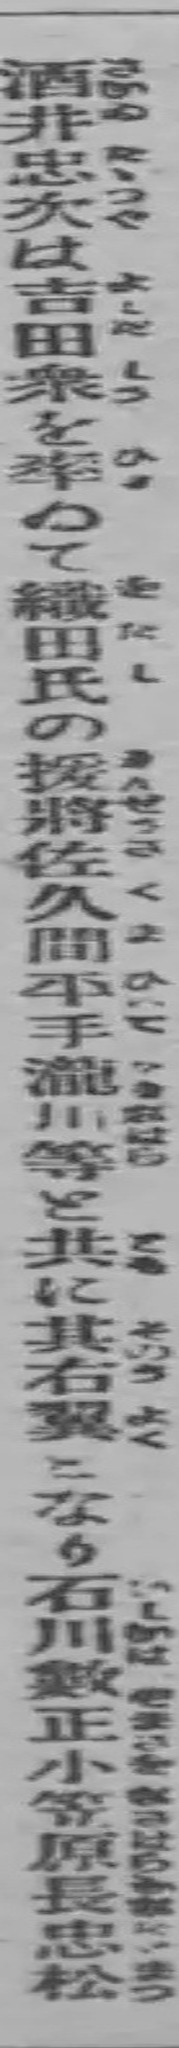酒井忠次は吉田衆を率ゐて織田氏の援将佐久間平手瀧川等と共に其右翼となり石川数正小笠原長忠松
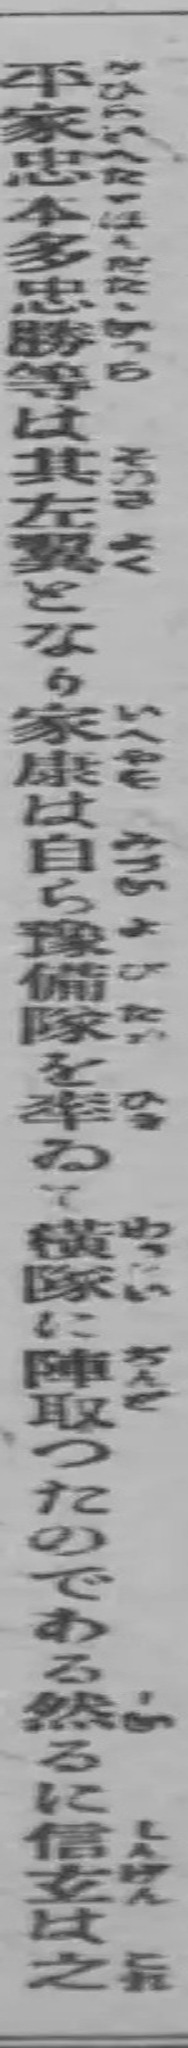平家忠本多忠勝等は其左翼となり家康は自ら予備隊を率ゐて横隊に陣取つたのである然るに信玄は之
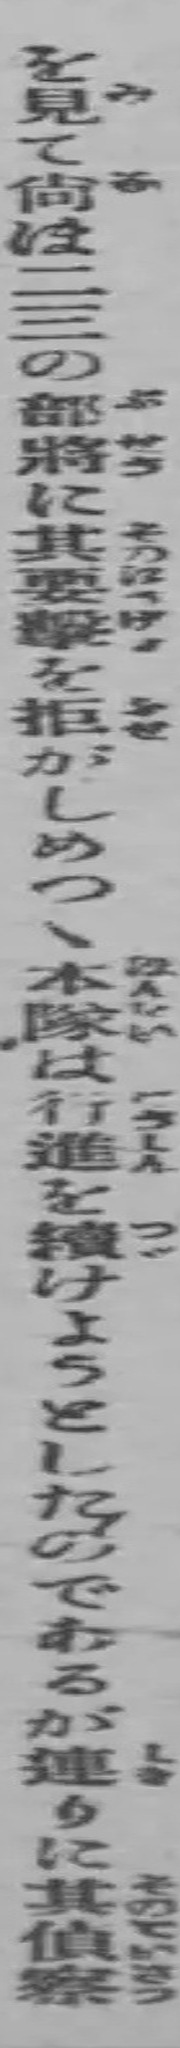を見て尚ほ二三の武将に其要撃を拒がしめつゝ本隊は行進を続けようとしたのであるが連りに其偵察
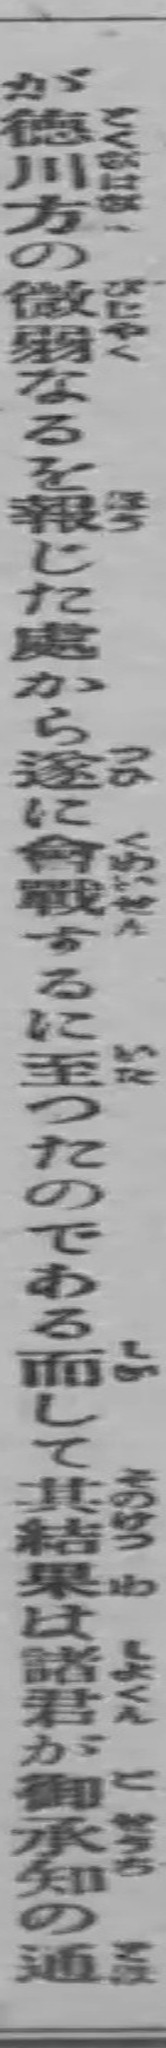が徳川方の微弱なるを報じた処から遂に会戦するに至つたのである而して其結果は諸君が御承知の通
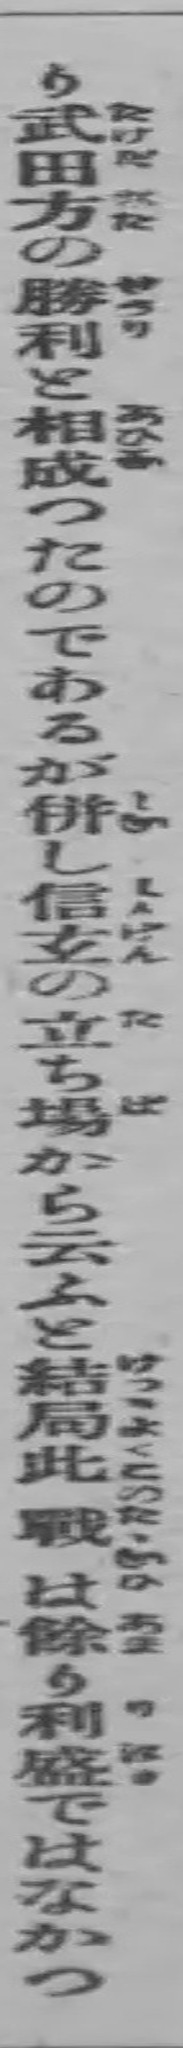り武田方の勝利と相成つたのであるが併し信玄の立ち場から云ふと結局此戦は余り利盛ではなかつ
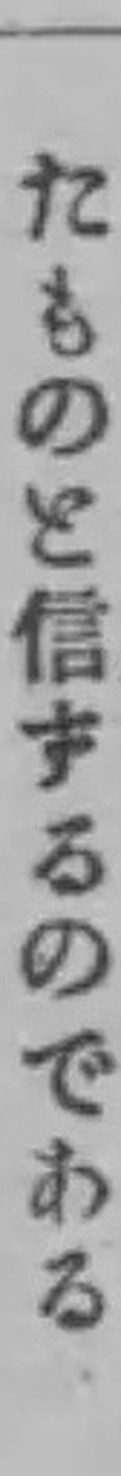たものと信ずるのである
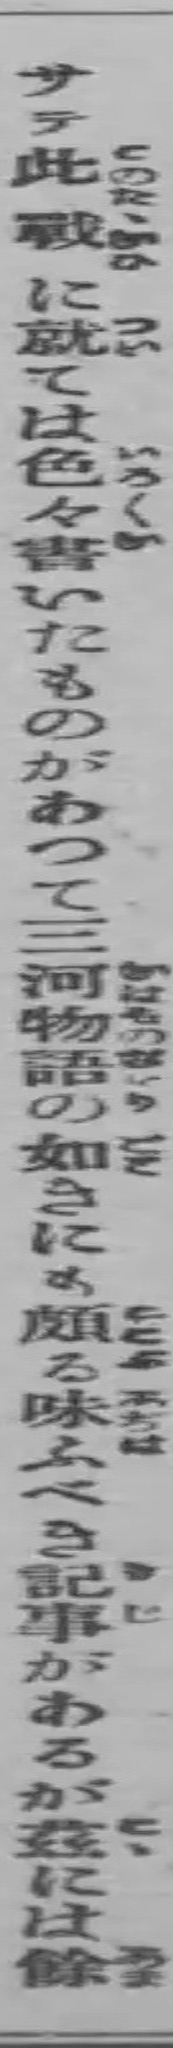サテ此戦に就ては色々書いたものがあつて三河物語の如きにも頗る味ふべき記事があるが茲には余
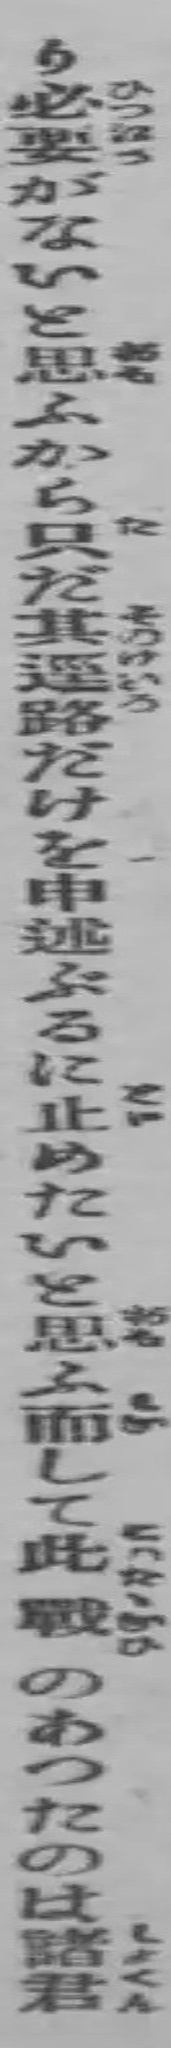り必要がないと思ふから只だ其経路だけを申述ぶるに止めたいと思ふ而して此戦のあつたのは諸君
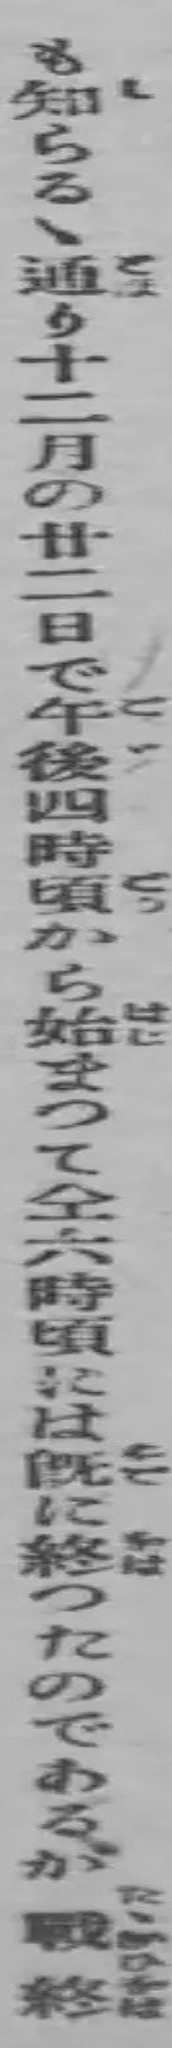も知らるゝ通り十二月の廿二日で午後四時頃から始まつて仝六時頃には既に終つたのであるが戦終
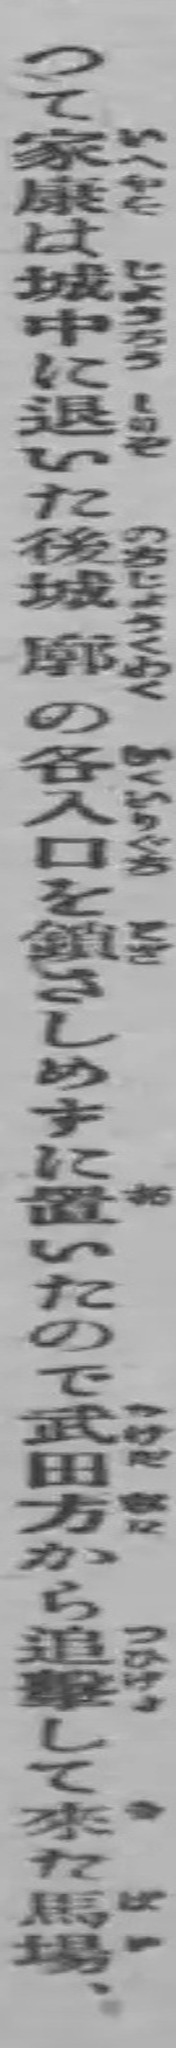つて家康は城中に退いた後城廓の各入口を鎖さしめずに置いたので武田方から追撃して来た馬場、
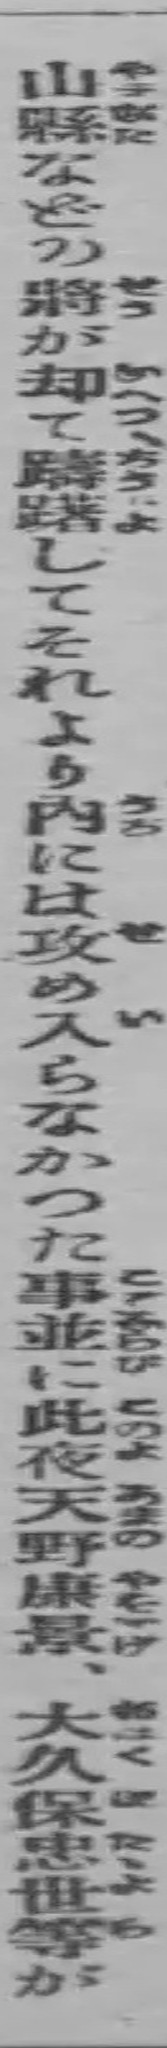山縣などの将が却て躊躇してそれより内には攻め入らなかつた事並に此夜天野康景、大久保忠世等が
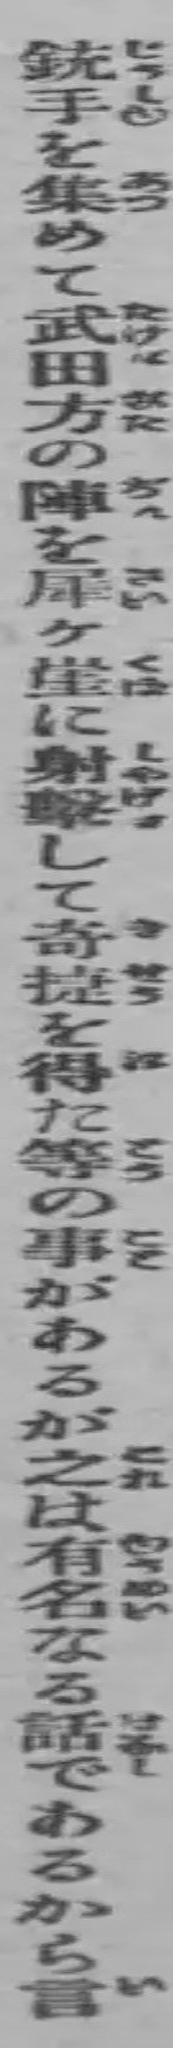銃手を集めて武田方の陣を犀ケ崖に射撃して奇捷を得た等の事があるが之は有名なる話であるから言
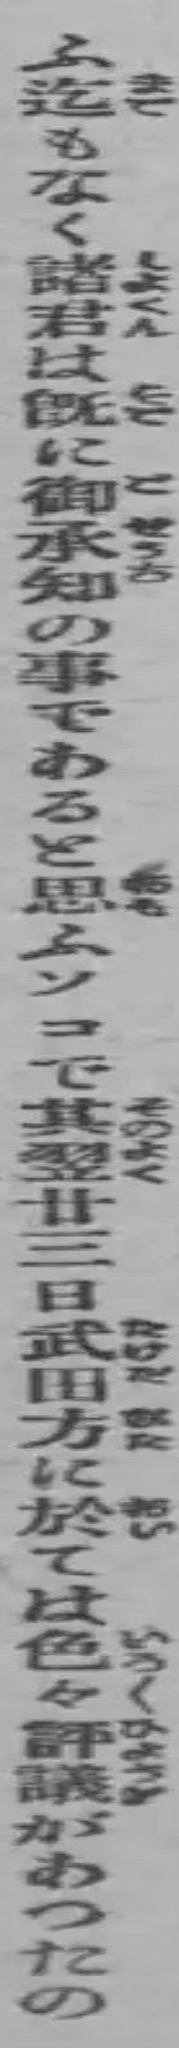ふ迄もなく諸君は既に御承知の事であると思ふソコで其翌廿三日武田方に於ては色々評議があつたの

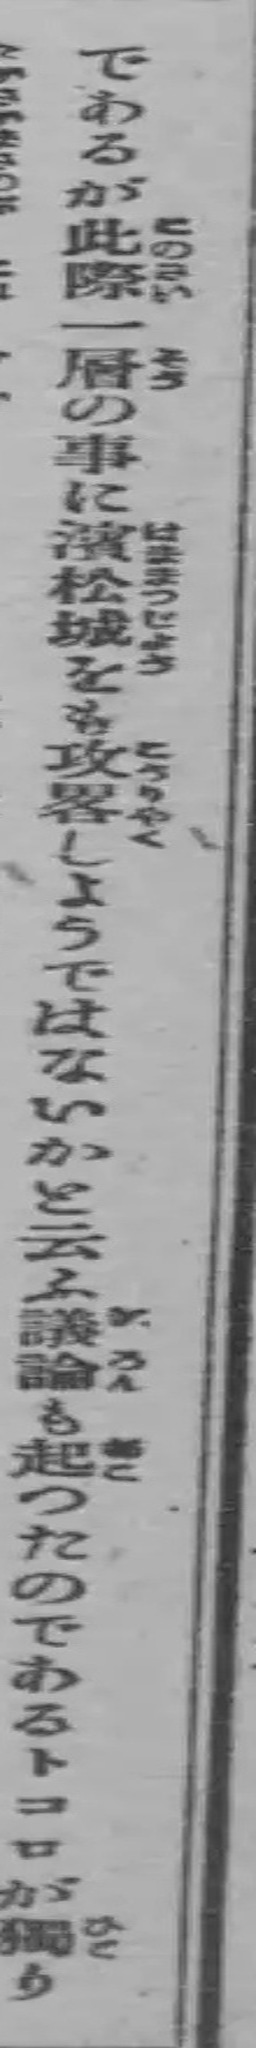であるが此際一層の事に浜松城をも攻略しようではないかと云ふ議論も起つたのであるトコロが独り
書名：豊橋市史談
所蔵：国立国会図書館 National Diet Library, JAPAN
